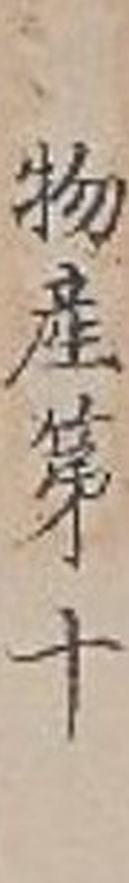物産第十
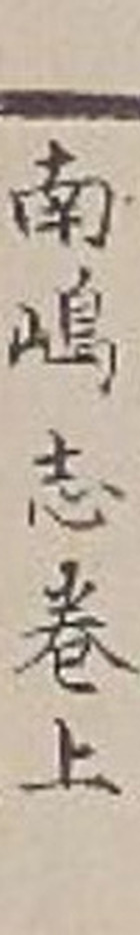南島志巻上
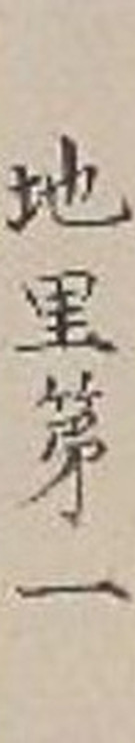地理第一
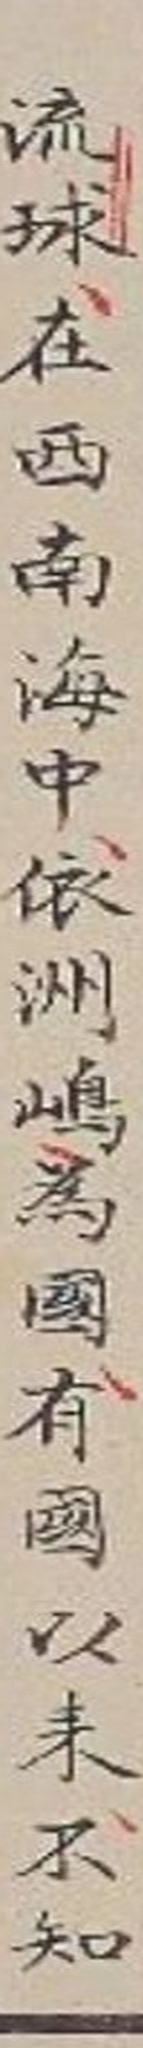流球、在西南海中、依洲島為国、有国以来、不知
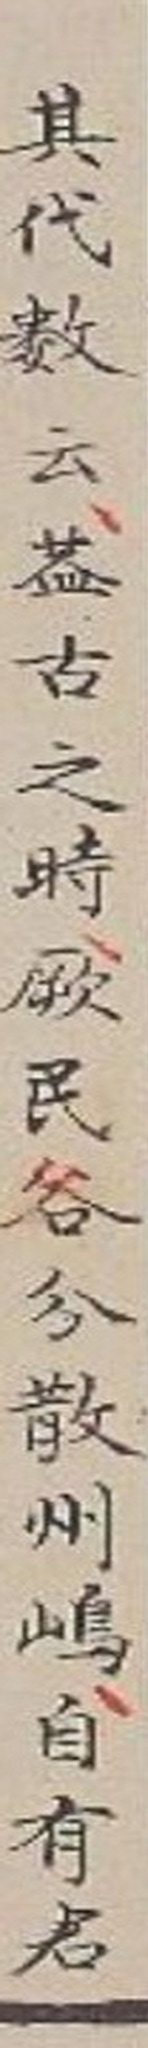其代数云、蓋古之時、厥民各分散州島、自有君
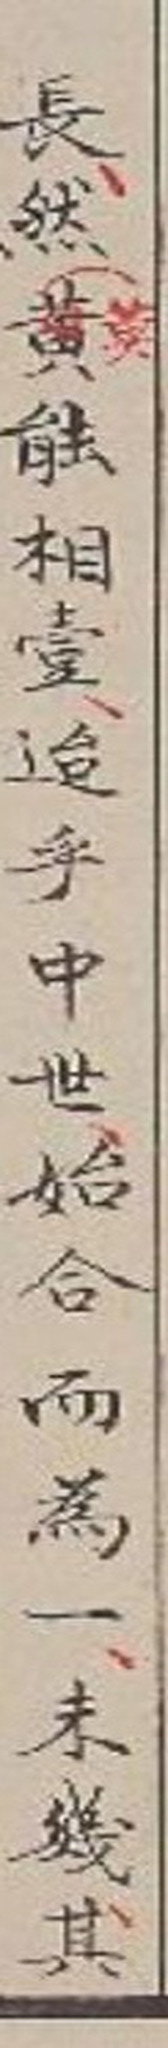長、然黄莫能相壱、迨乎中世、始合而為一、未幾、其
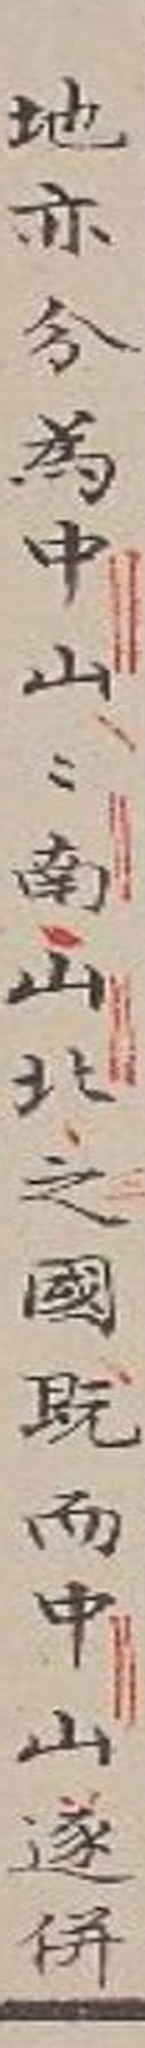地亦分為中山々南・山北・之三国、既而中山遂併
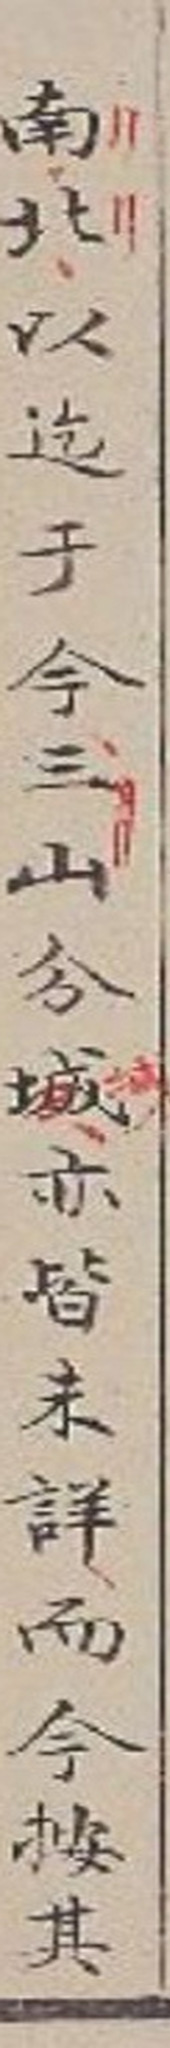南・北・以迄于今、三山分城域亦皆未詳而今按其
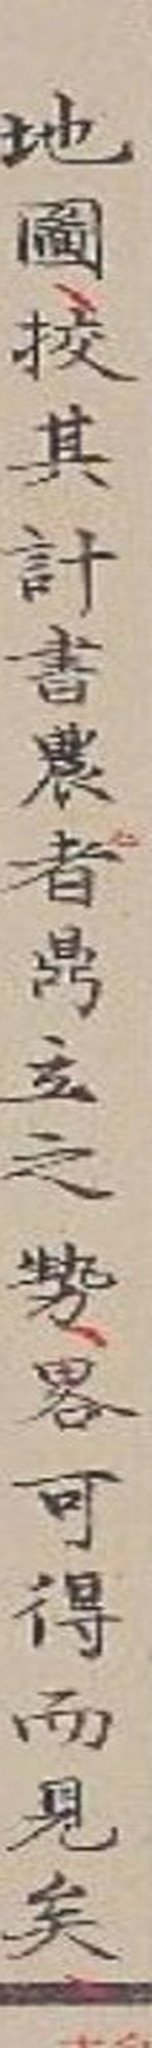地図、挍其計書農者鼎立之勢、略可得而見矣、
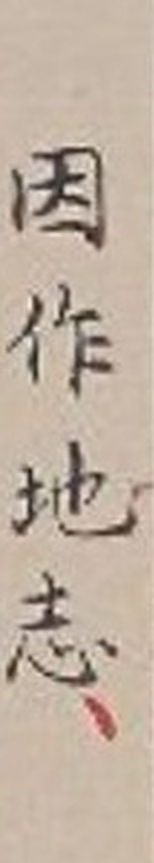因作地志、
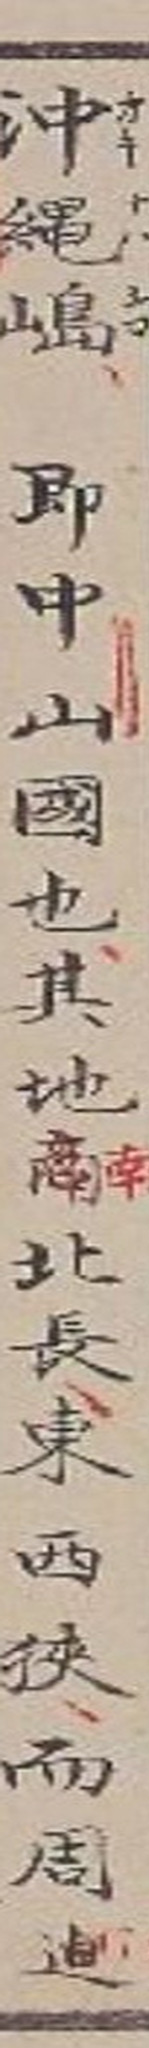沖縄島、即中山国也、其地商南北長、東西狹、而周迫廻

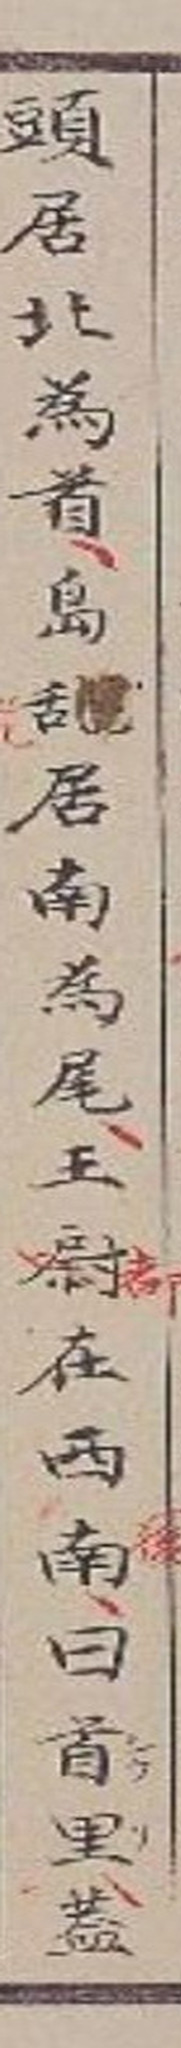頭居北為首、島尻居南為尾、王尉都在西南、曰首里、蓋
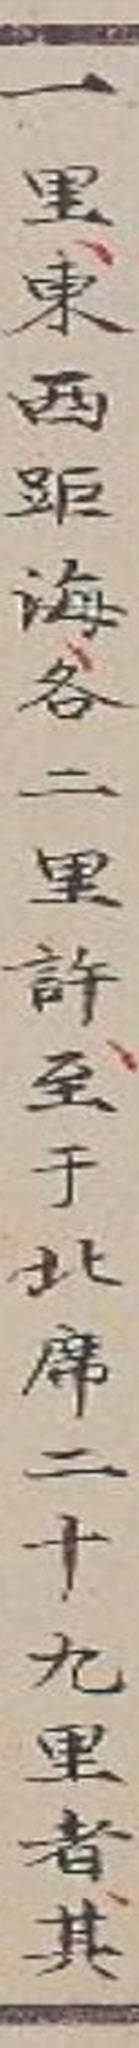一里、東西距海、各二里許、至于北席二十九里者、其
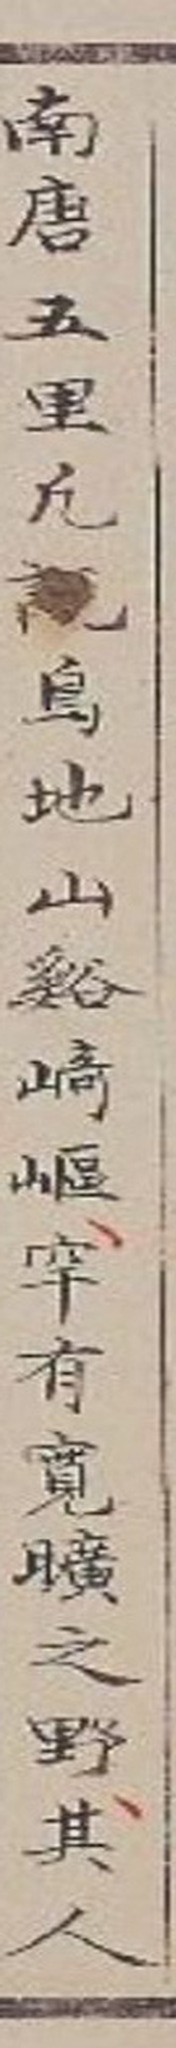南唐五里凡島地山谿崎嶇、罕有寛曠之野、其人
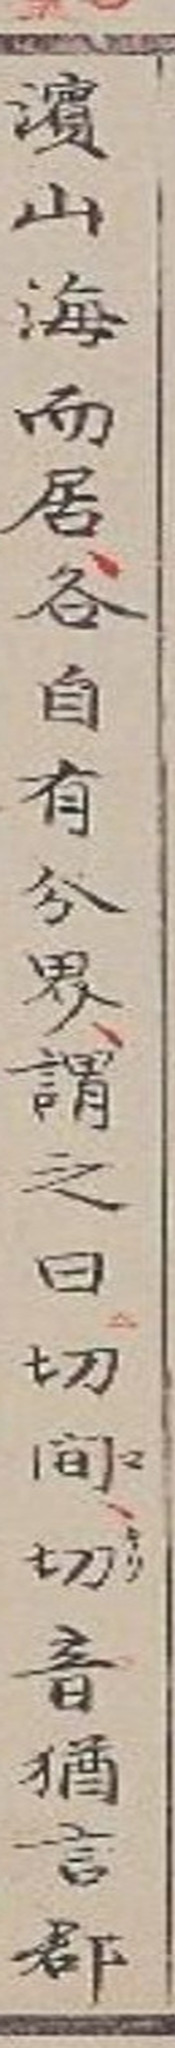浜山海而居、各自有分界、謂之曰切間、切音猶言郡
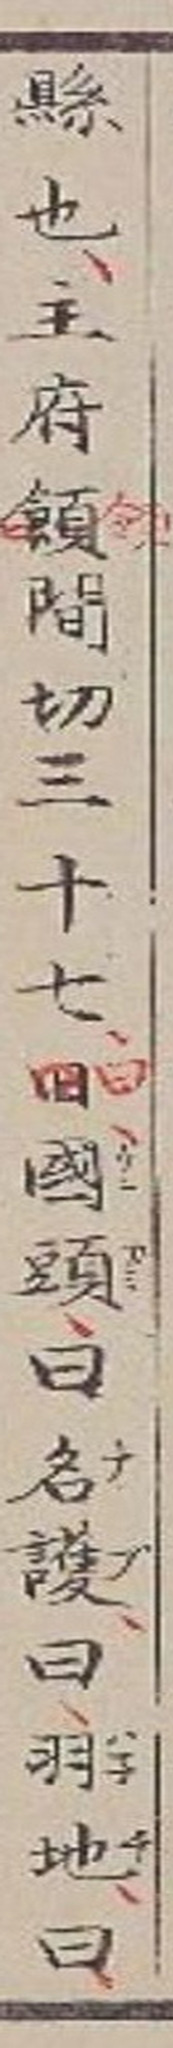県也、主府領間切三十七、旧曰、国頭、曰名護、曰羽地、曰、
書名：南島志 全
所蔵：University of the Ryukyus Library
